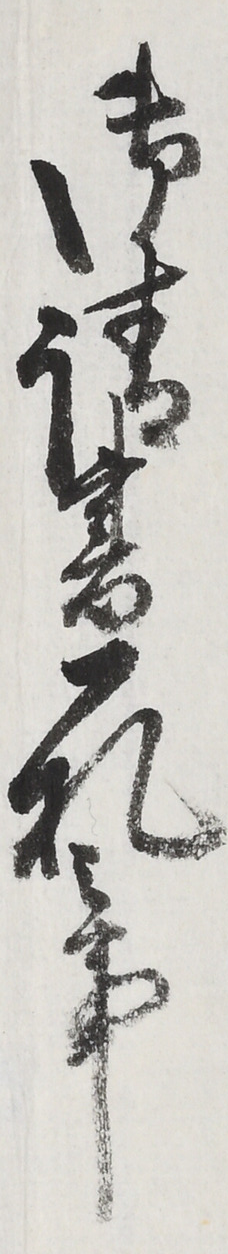御請書一札之事
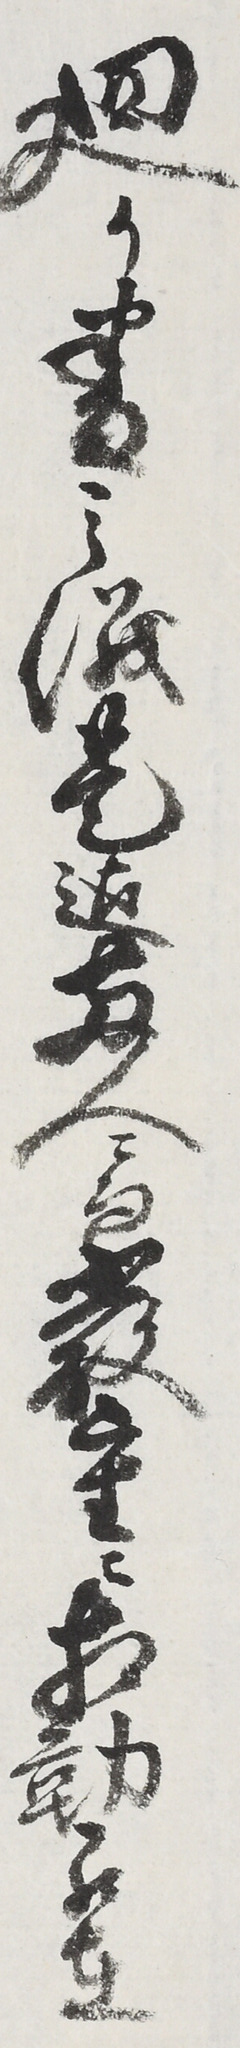廻り番之儀是迄両人ニ而厳重ニ相勤罷在
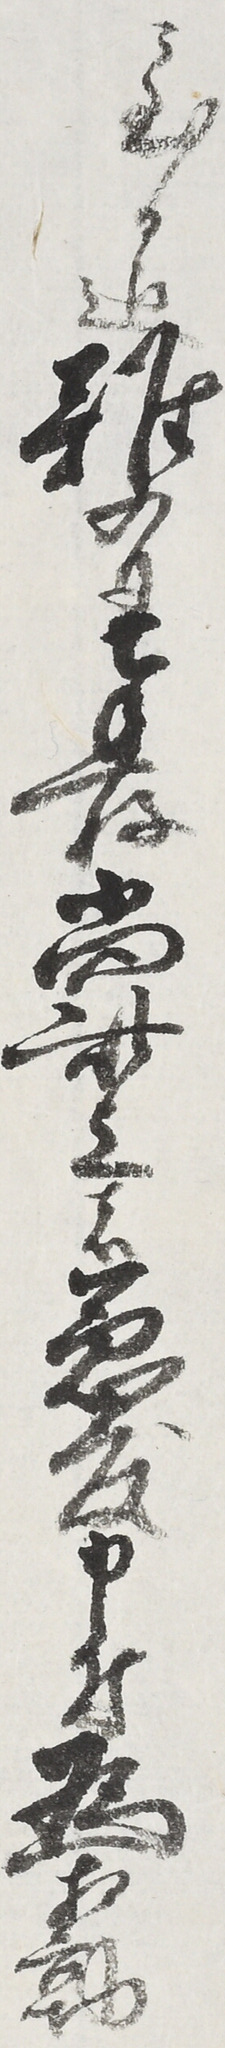ニ至る迄難有奉存尚此上者急度申付為相勤
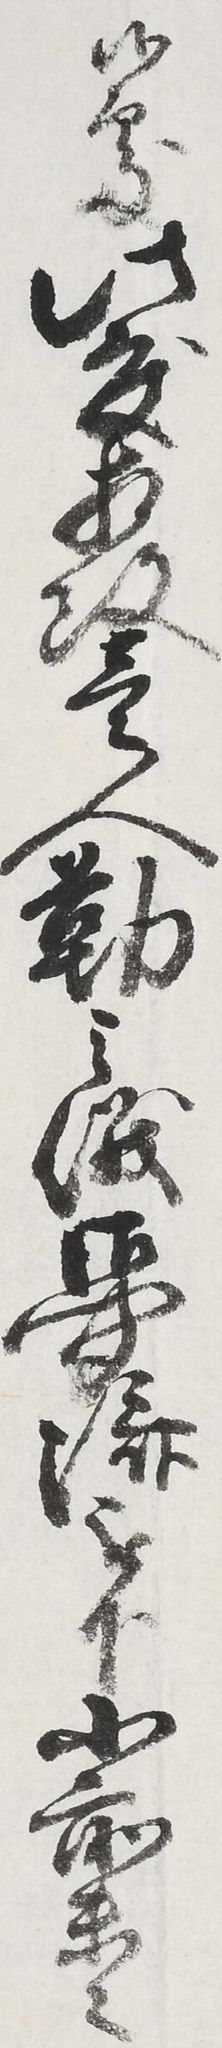候処此度相改壱人勤之儀御聞済被下小前末々
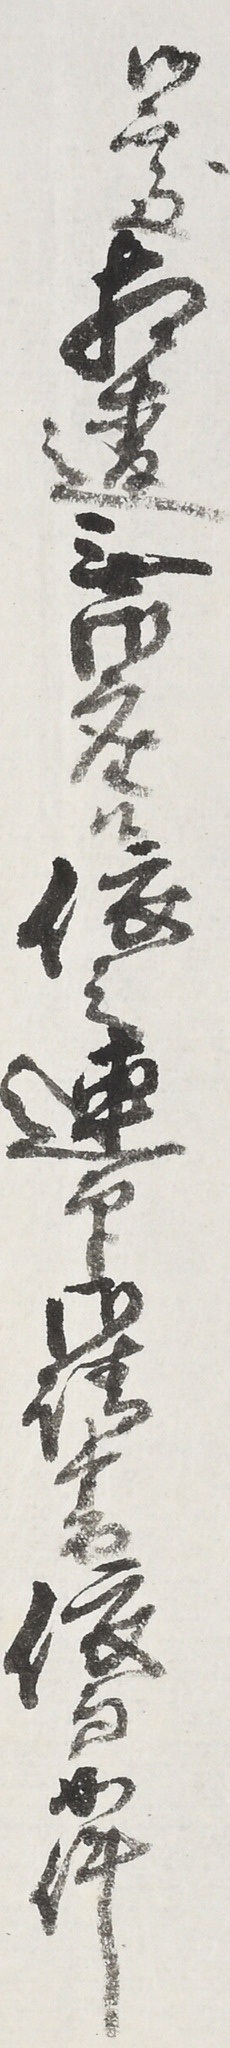候処相違無御座候依之連印御請書依而如件
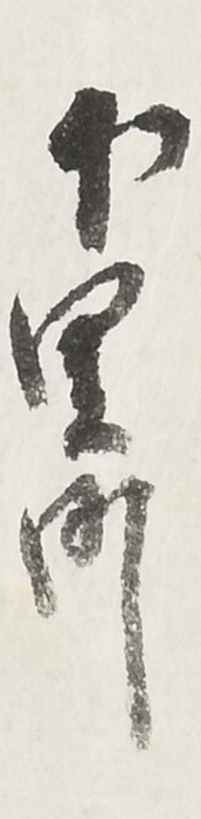下里町
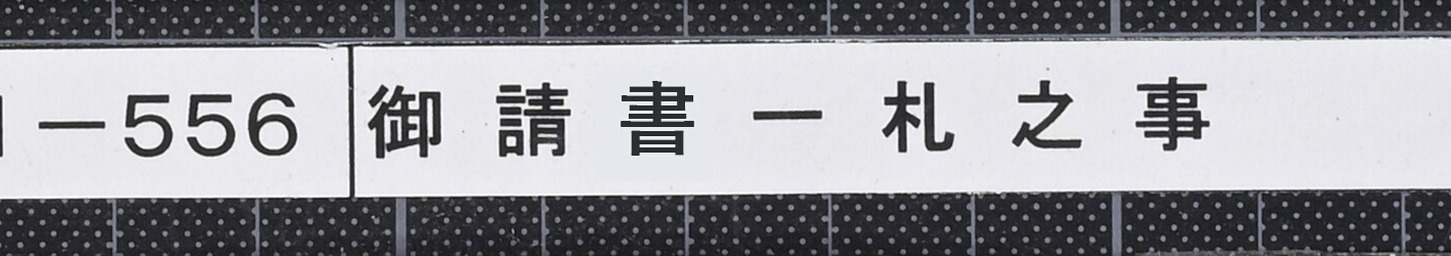御請書一札之事
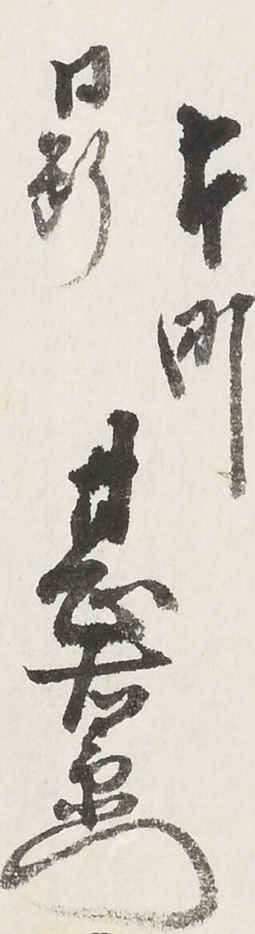同断甚右衛門㊞
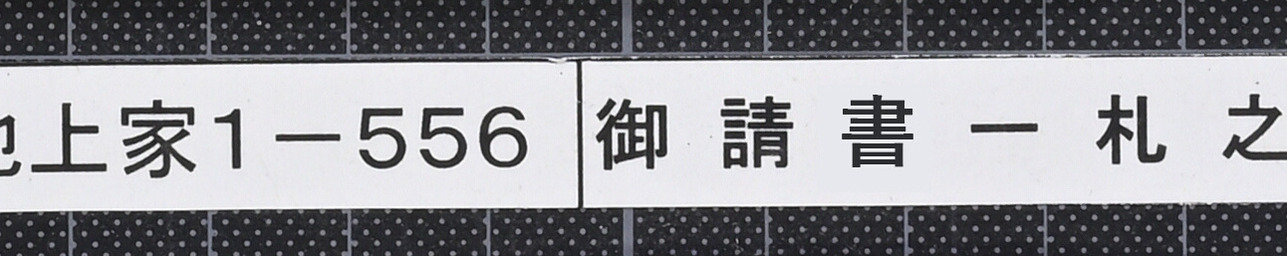御請書一札之事
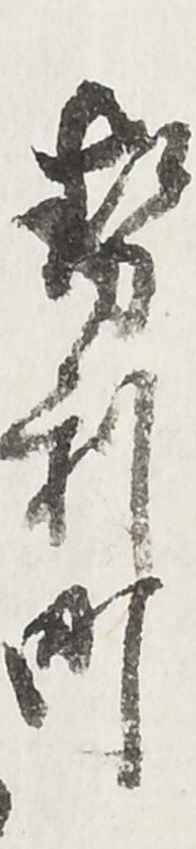勢利町
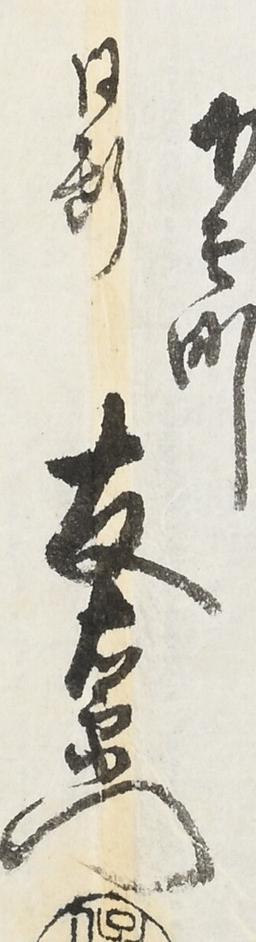同断友右衛門㊞
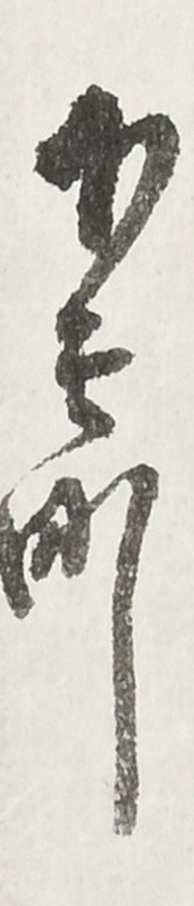下里町
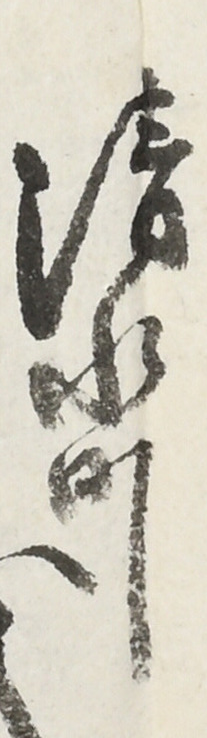清水町

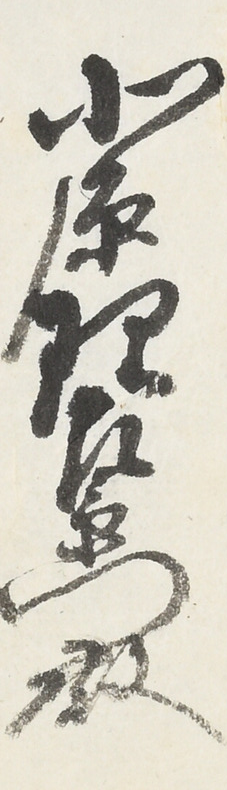北原理左衛門殿
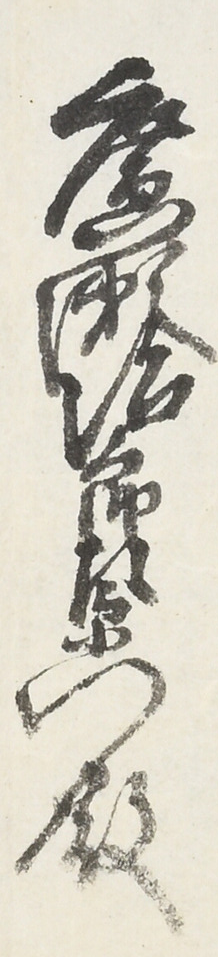広瀬治郎左衛門殿
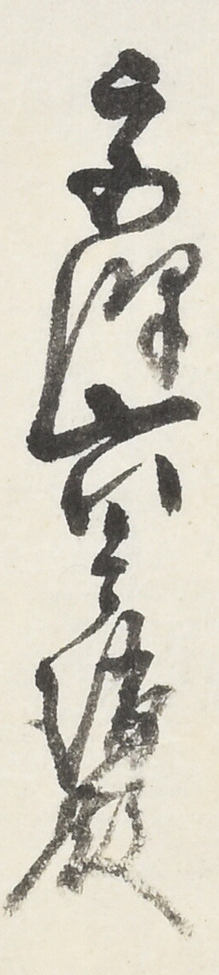宮澤六兵衛殿
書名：御請書一札之事
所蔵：伊那市立高遠町図書館・合同会社AMANE
